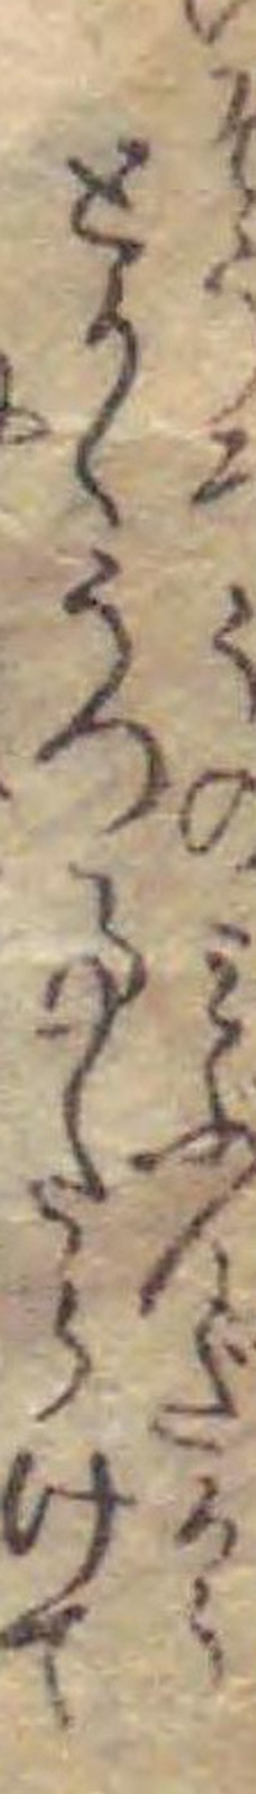とかくうつ事たらけて
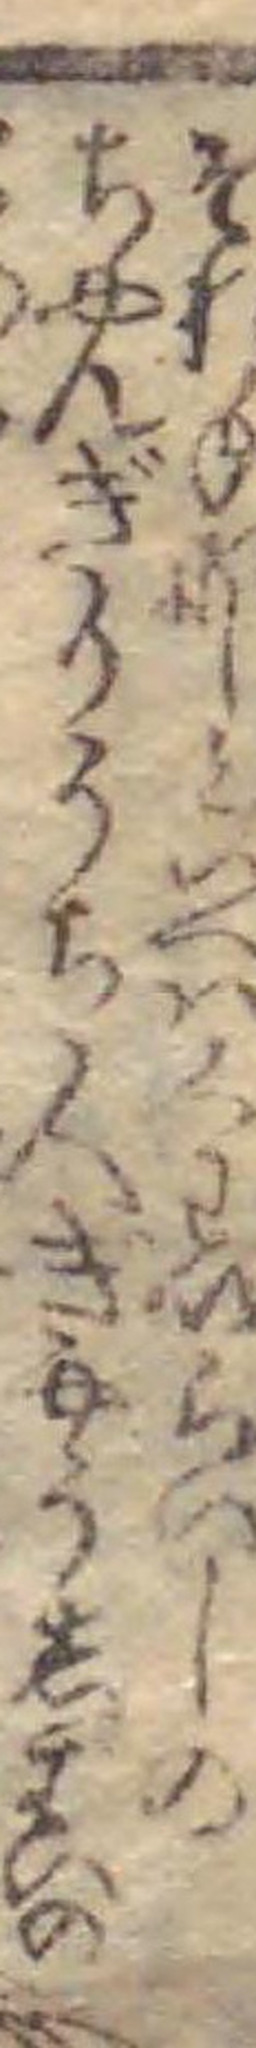ちやんぎりうち人ぎやうしはいの
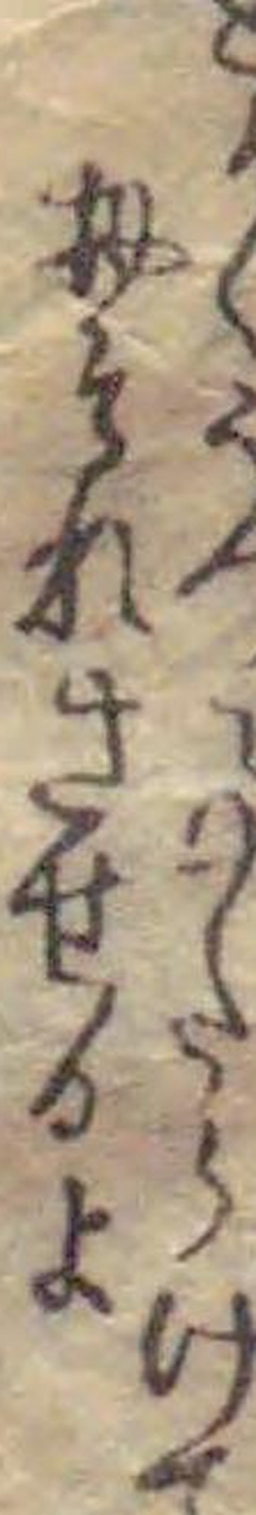おそれさせるよ
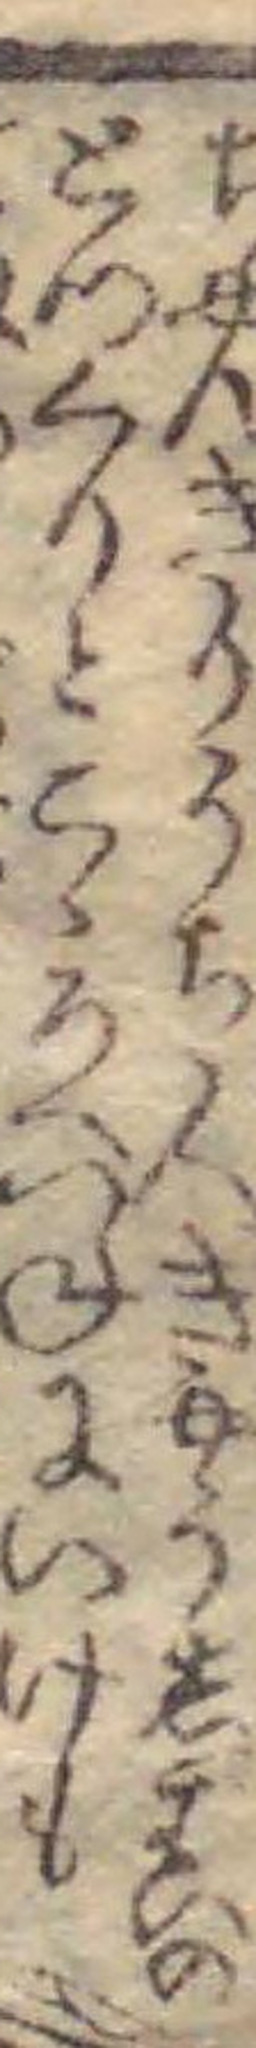とつくりとこゝろへつねにいけも
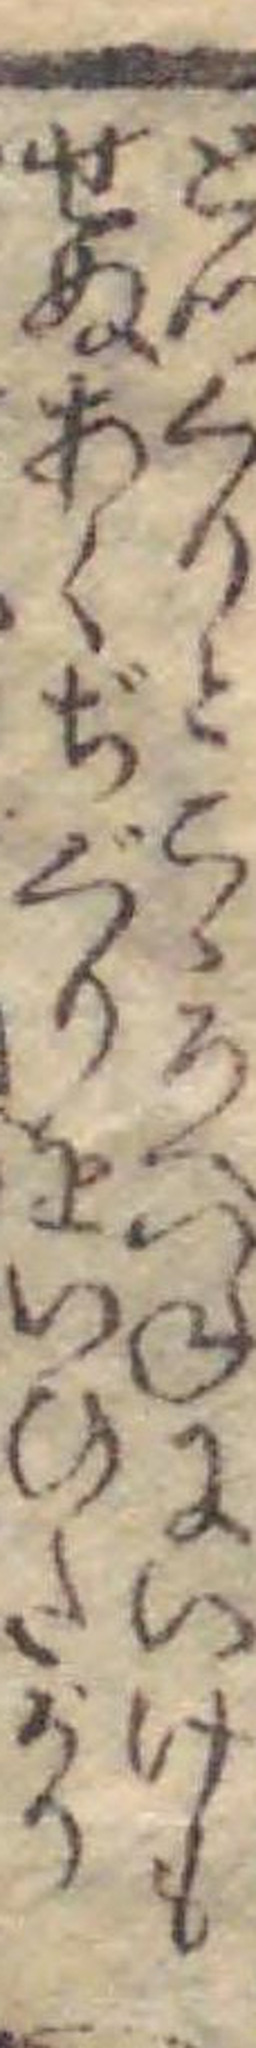せぬあくぢぐりをいひたがり
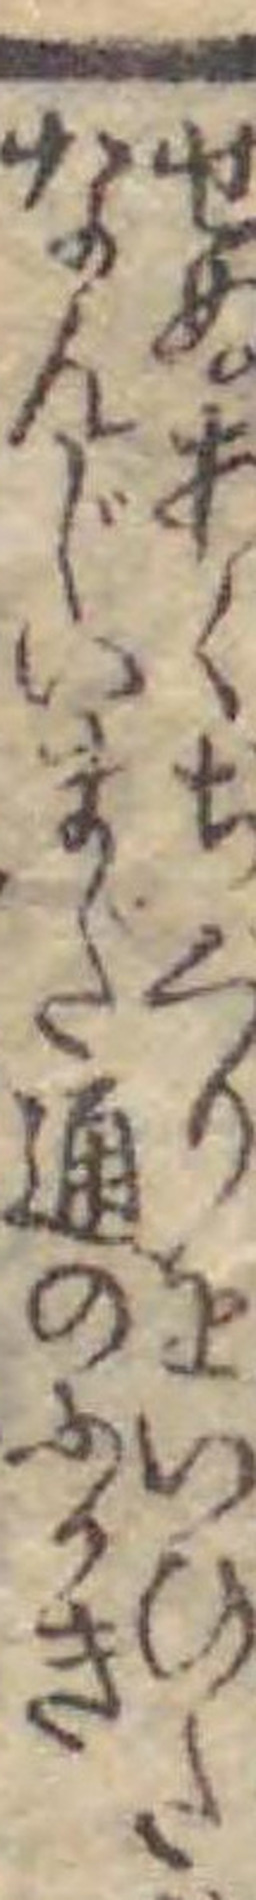なんじいまだ通のふかき
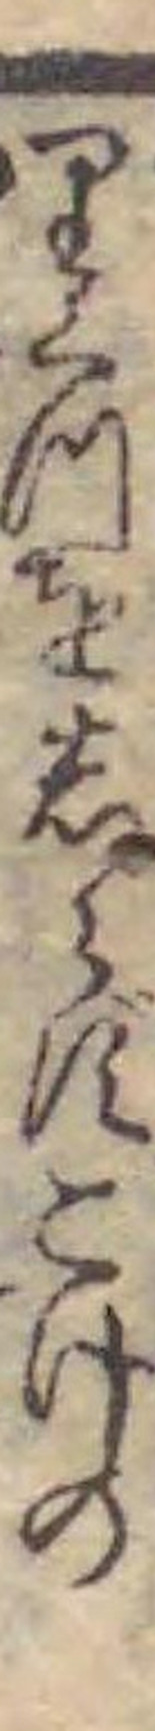りくつをしらずこけの
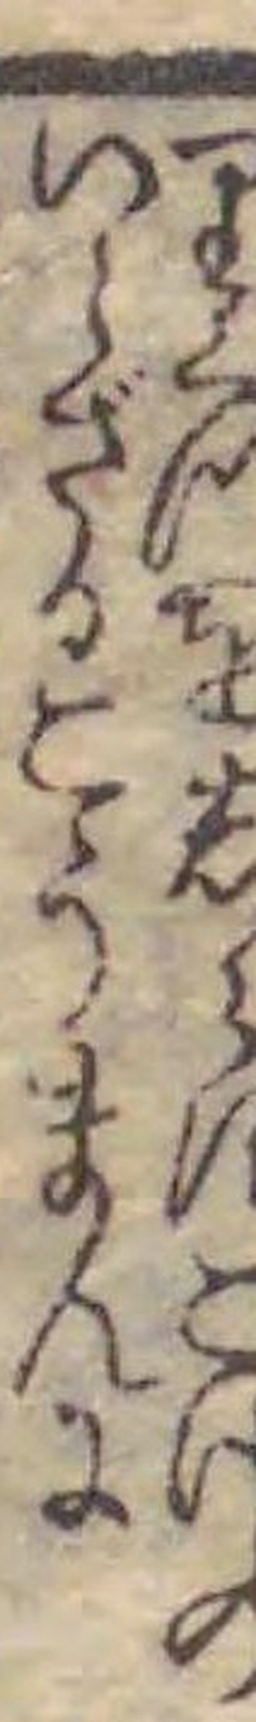いらざるこうまんに
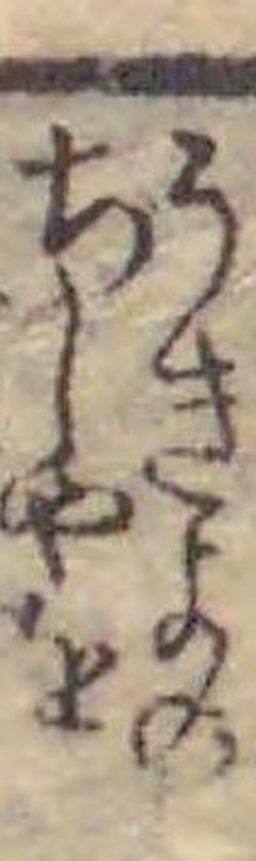ちしやを
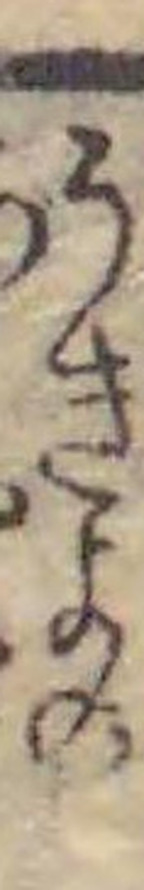うきよの
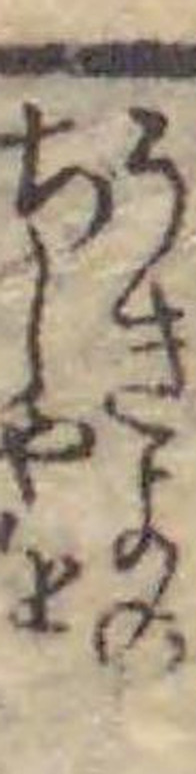ちしやを
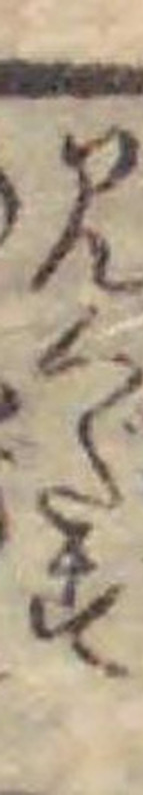見くだす
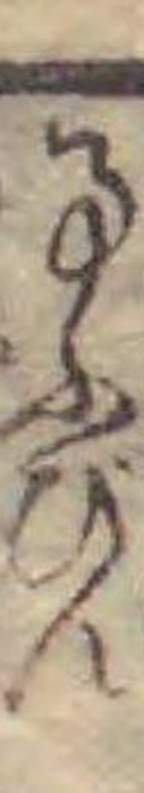事ふびん
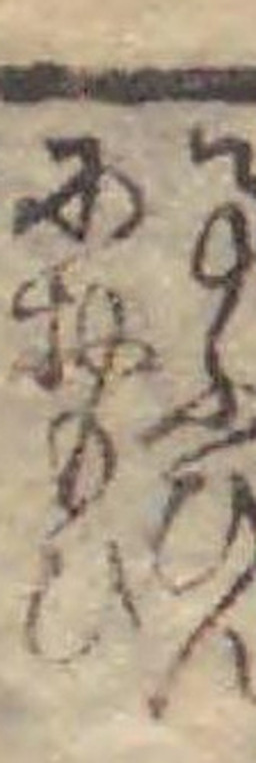におもひ
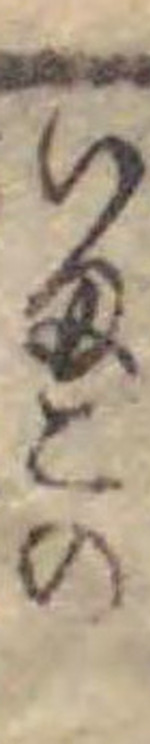いまこの
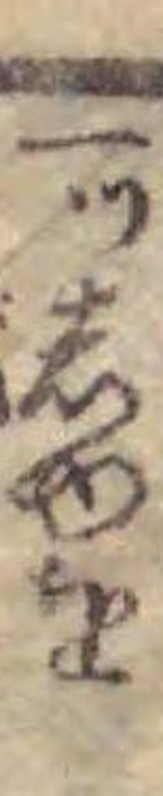一ッしやを
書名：人間一心覗替繰 : 2巻
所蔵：国立国会図書館 National Diet Library, JAPAN
